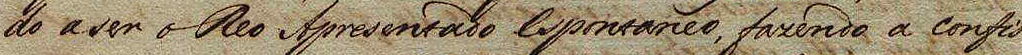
do a ser o Reo Apresentado espontaneo, fazendo a confis
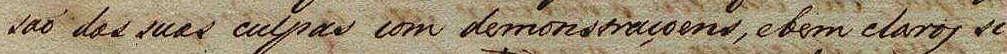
saõ das suas culpas com demonstraçoens, e bem claros si
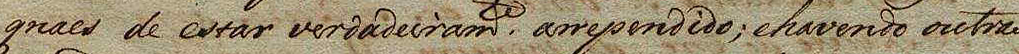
gnaes de estar verdadeiram.te arrependido; e havendo outras
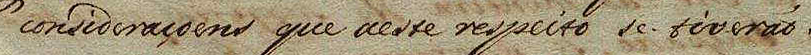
consideraçoens que neste respeito se fizeraõ
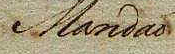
Mandaõ
